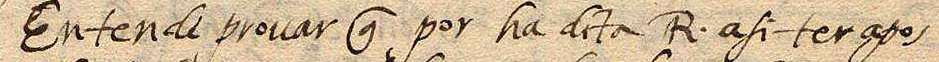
Entende prouar q̅ por ha dita R. asi ter apos
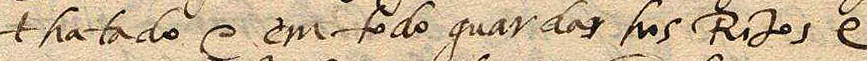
thatado e em todo guardar hos Ritos e
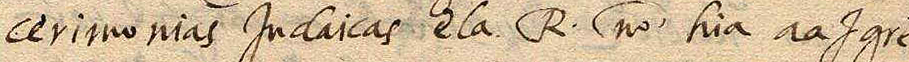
cerimonias Judaicas ela R. nō hia aa Jgre
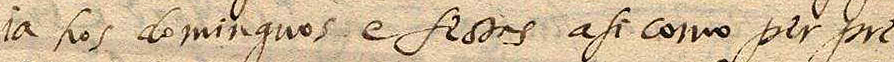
ia hos dominguos e festas asi como per pre
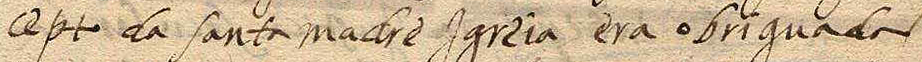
cepto da santa madre Jgreia era obriguada
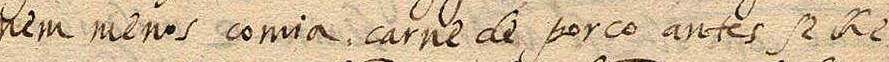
nem menos comia carne de porco antes se lhe
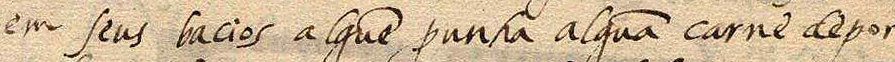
em seus bacios algu̅e punha algu̅a carne de por
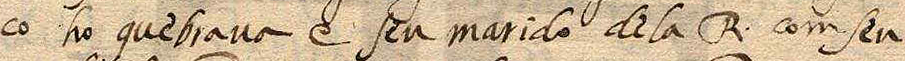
co ho quebraua e seu marido dela R. com seu
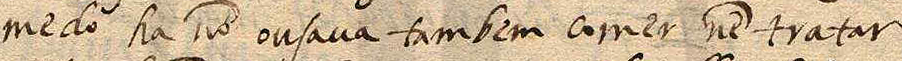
medo ha nō ousaua tambem comer nē tratar
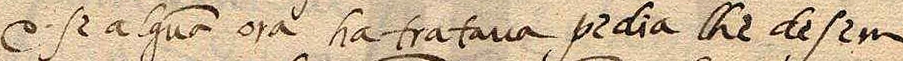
e se algu̅a ora ha trataua pedia lhe desem
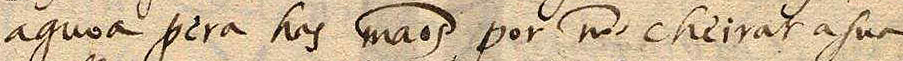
aguoa pera has mãos por nō cheirar a sua
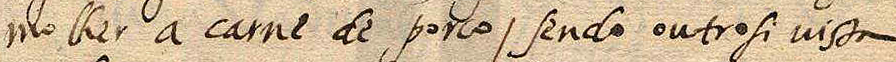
molher a carne de porco / sendo outrosi uista
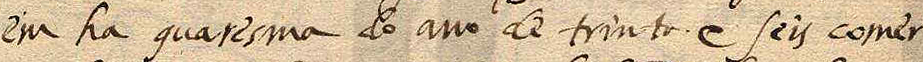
em ha quaresma do ano de trinta e seis comer
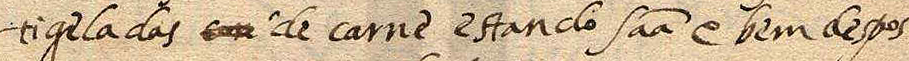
tigeladas _ de carne estando saā e bem despos
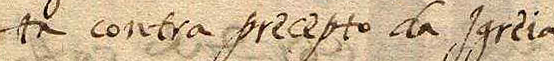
ta contra precepto da Jgreia
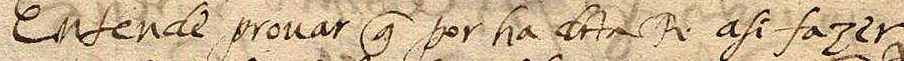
Entende prouar q̅ por ha dita R. asi fazer
